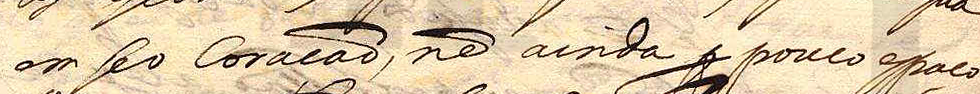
em seo coração, nē ainda ꝑ pouco espaço
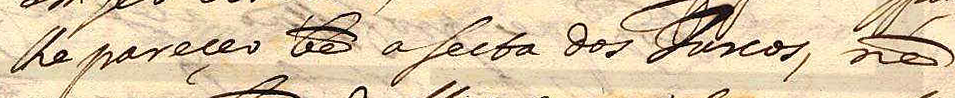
lhe pareceo bē a secta dos Turcos, nē
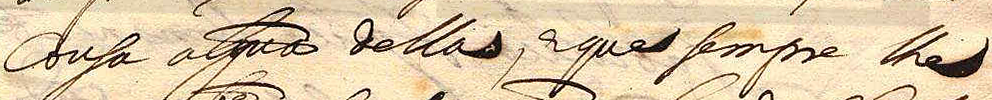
cousa algūa della, E que sempre lhe
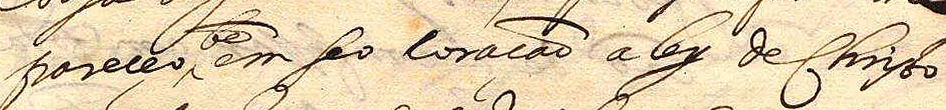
pareceo bē em seo coraçaõ a ley de Christo
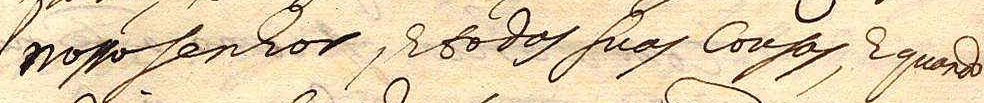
nosso senhor, E todas suas cousas, E quando
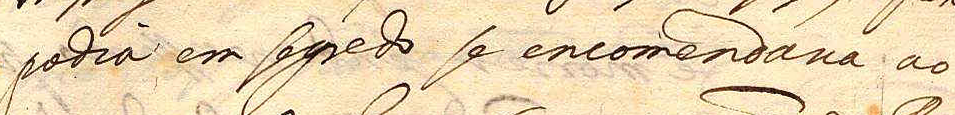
podia em segredo se encomendaua ao
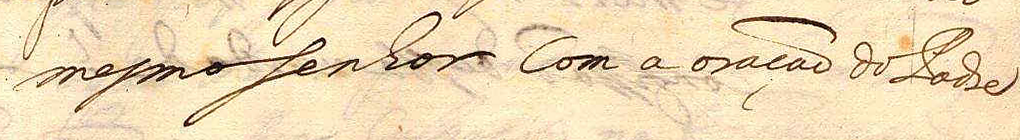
mesmo senhor com a oração do Padre
